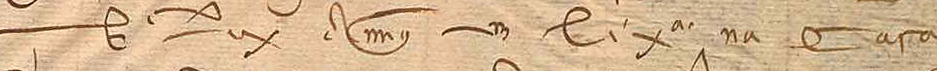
j̄ bcLix Annꝯ em lixa na Casa
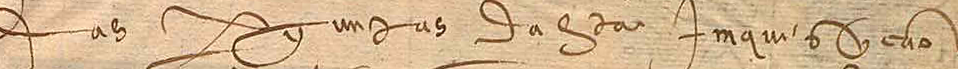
das ꝑguntas da Sta Jmquisyção
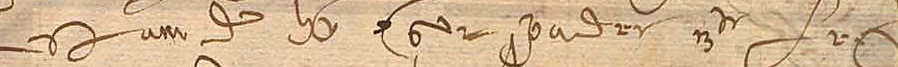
estamdo hy o s̄or padre mte frey
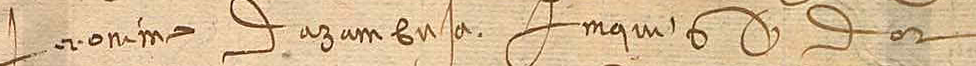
Jeronimo dazambuJa Jmquisydor
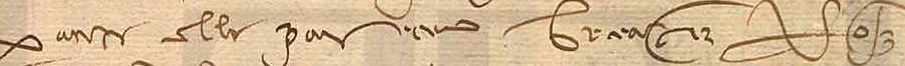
ꝑante elle pareçeo breatiz Rōjz
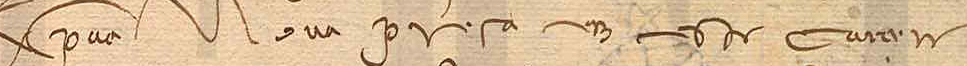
xp̄aa Noua presa em este carçere
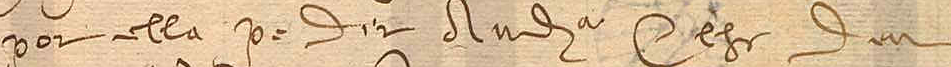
por ella pedir Audja e lhe deu
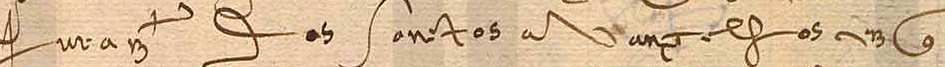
Juramto dos Sanctos avangelhos em q̄
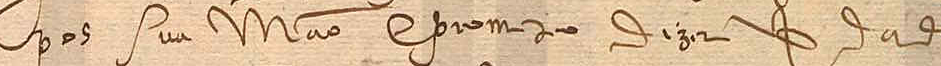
pos Sua Mão e prometeo dizer ꝟdade
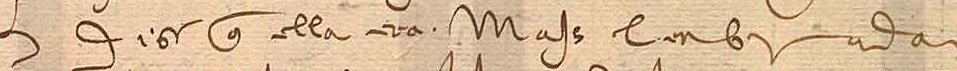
e dise q̄ ella era Majs lenbrada
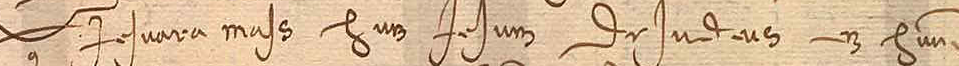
q̄ JeJuara maJs hum JeJum de Judeus em hūu
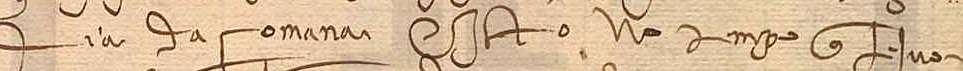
dia da somana e Jsto No tempo q̄ JeJuou
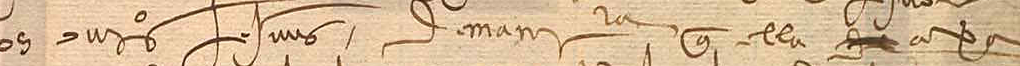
os outos JeJūus / de manrra q̄ ella _ aꝟa
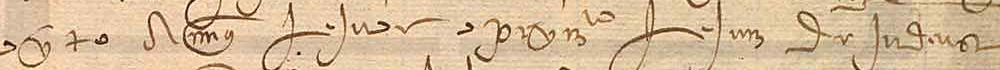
oyto Annꝯ JeJuou o prymro JeJum de Judeus
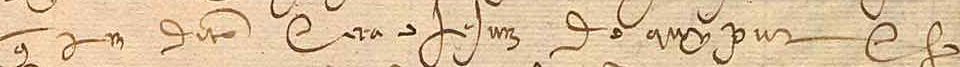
q̄ tem dit̄o e era o JeJum do quypur e ho
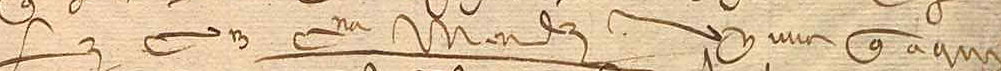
fez Com Cna Mendez Vyuva q̄ aquy
